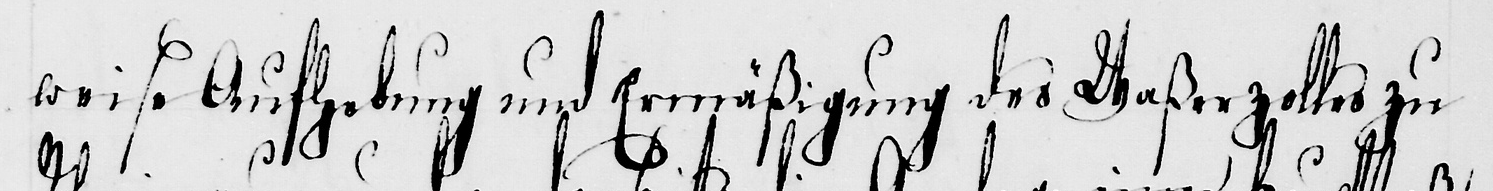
weise Aufhebung und Ermäßigung des Waßerzolles zu
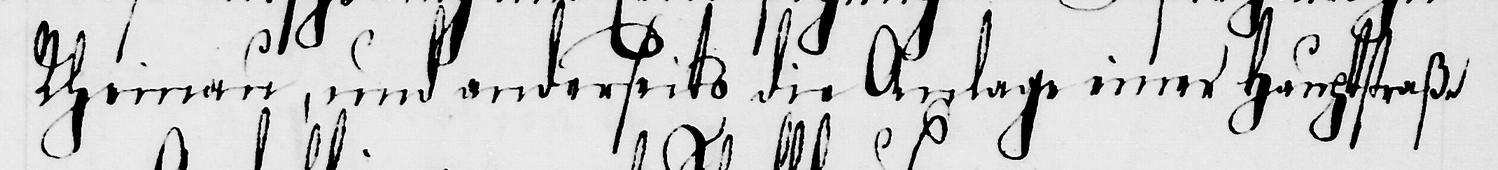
Rheinau, und anderseits die Anlage einer Hauptstraße
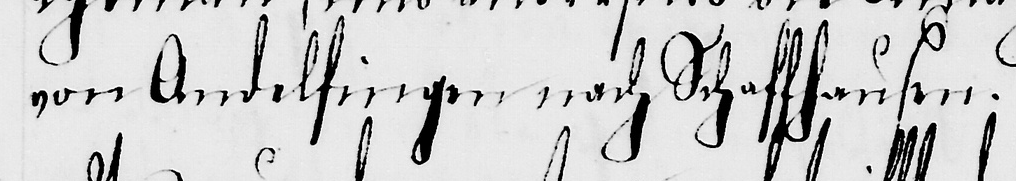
von Andelfingen nach Schaffhausen.
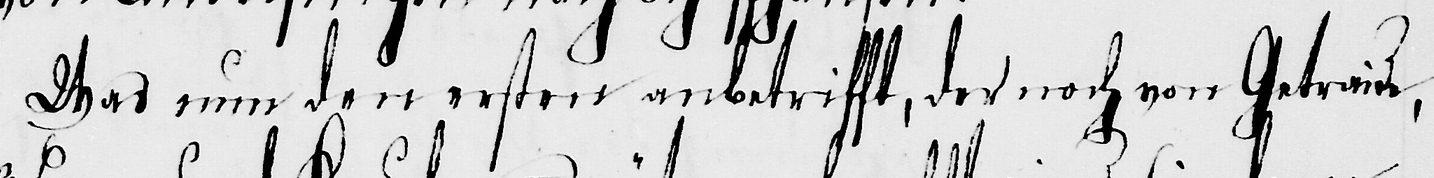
Was nun den ersten anbetrifft, der noch von Getraide,
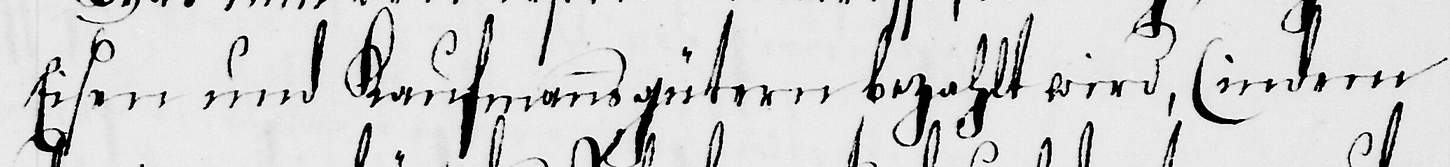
Eisen und Kaufmannsgütern bezahlt wird, (indem
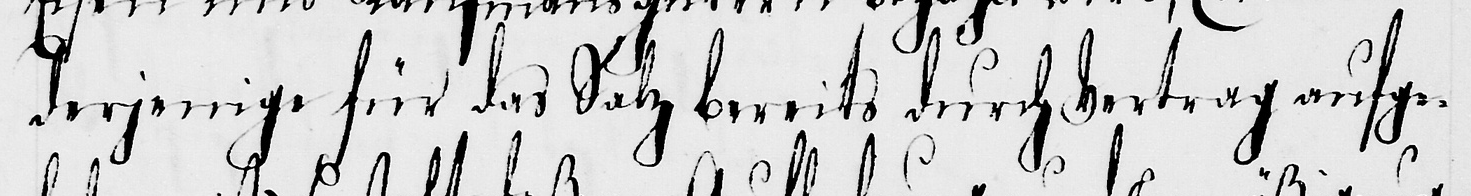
derjenige für das Salz bereits durch Vertrag aufge¬
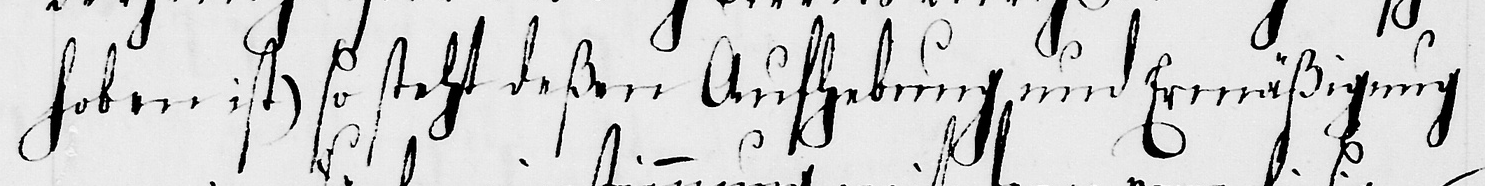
hoben ist) so steht deßen Aufhebung und Ermäßigung
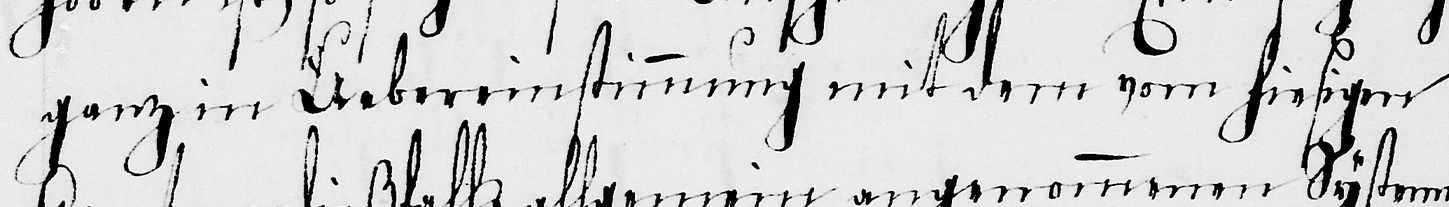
ganz in Uebereinstimmung mit dem vom hiesigen
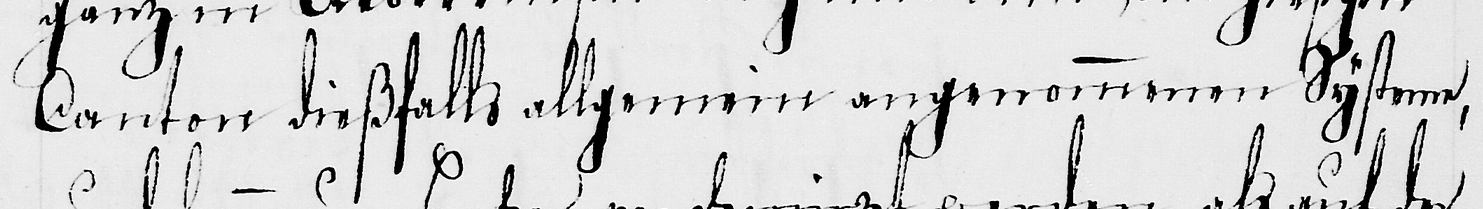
Canton dießfalls allgemein angenommenen Systeme,
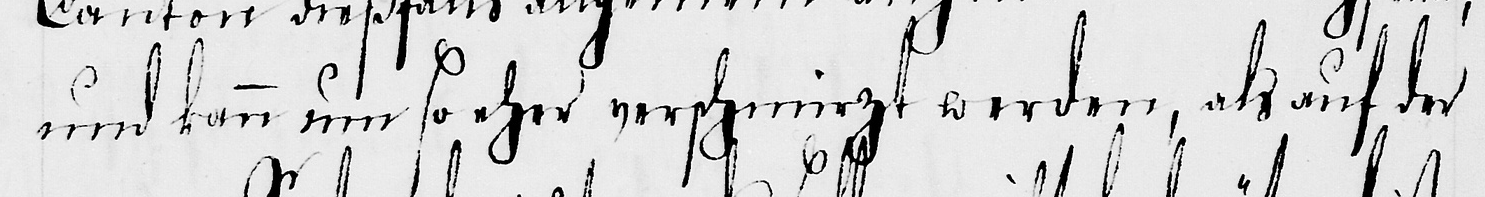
und kann um so eher verschmerzt werden, als auf der
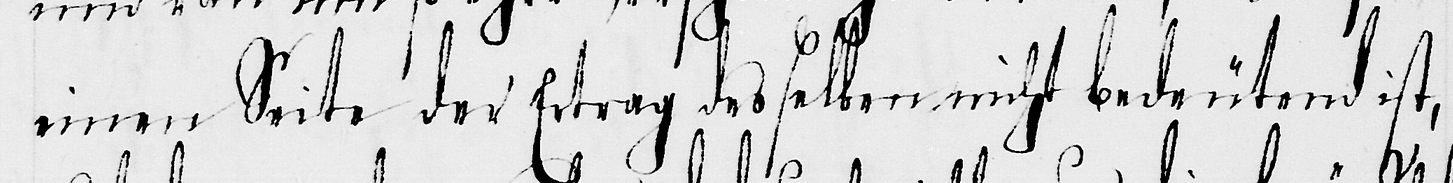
einen Seite der Ertrag desselben nicht bedeutend ist,
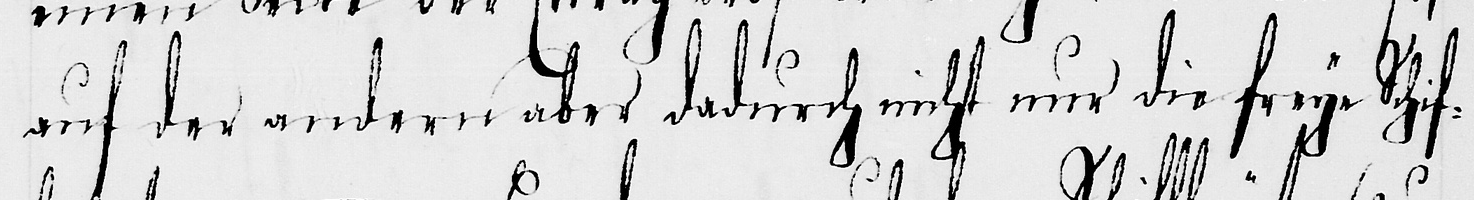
auf der andern aber dadurch nicht nur die freye Sc¬
